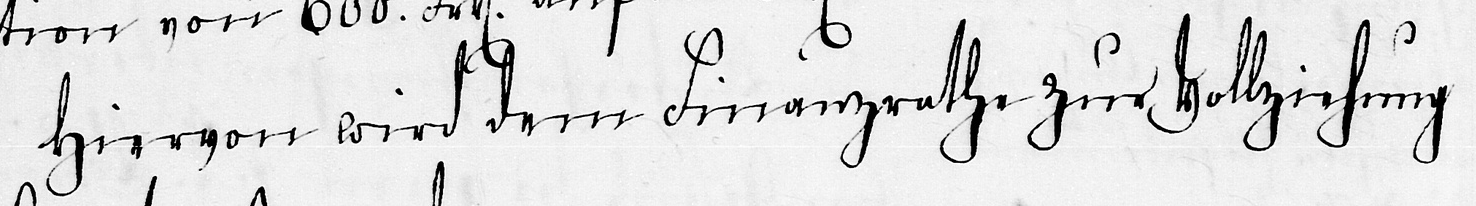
Hiervon wird dem Finanzrathe zur Vollziehung
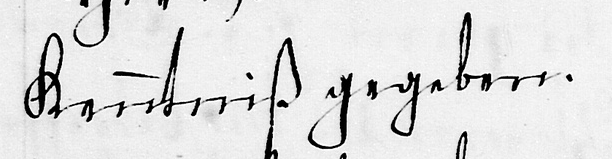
Kenntniß gegeben.
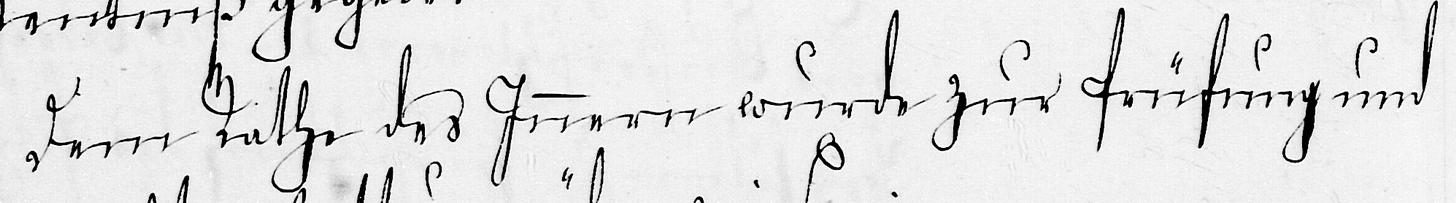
Dem Rathe des Innern wurde zur Prüfung und
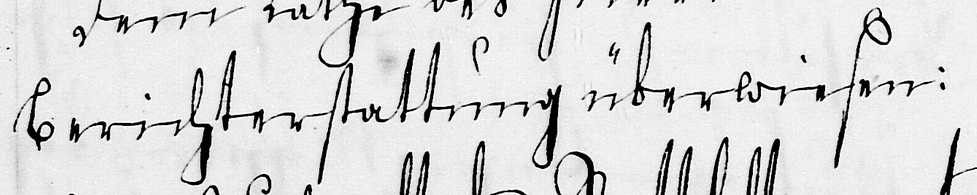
Berichterstattung überwiesen:
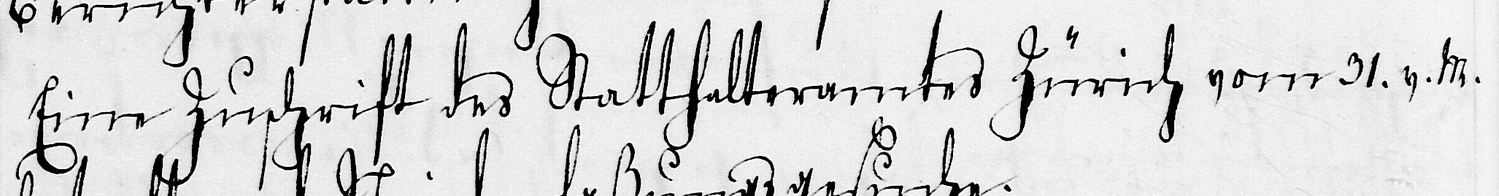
Eine Zuschrift des Statthalteramtes Zürich vom 31. v.
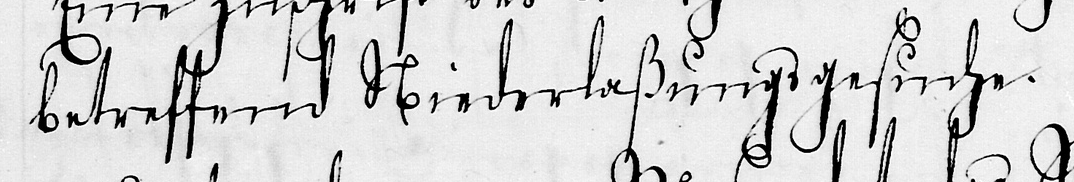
betreffend Niederlaßungsgesuche.
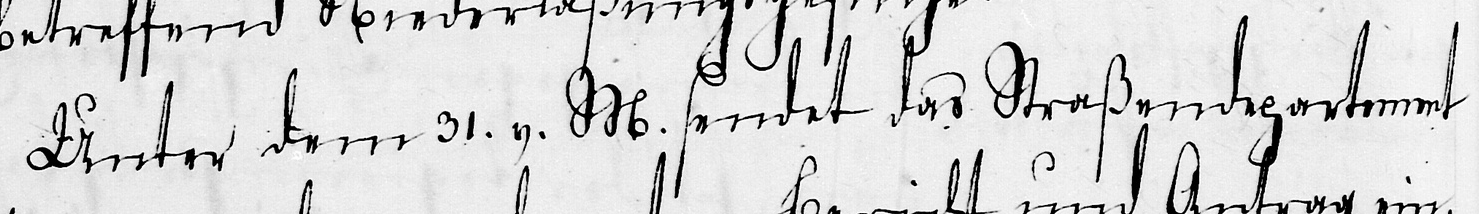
Unter dem 31. v. M. sendet das Straßendepartement
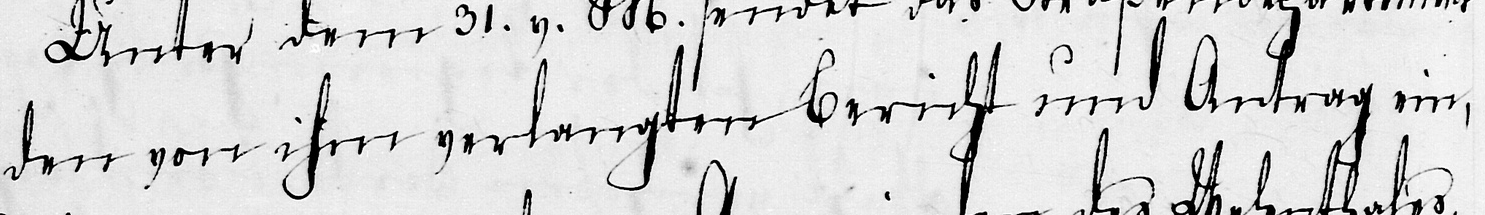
den von ihm verlangten Bericht und Antrag ein,
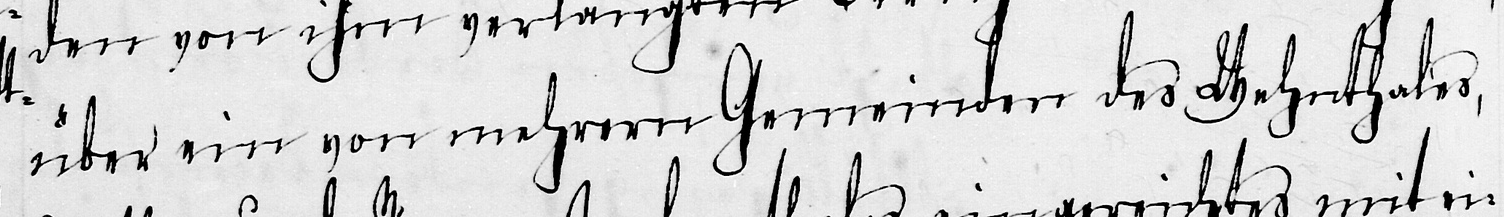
über ein von mehrern Gemeinden des Wehnthales,
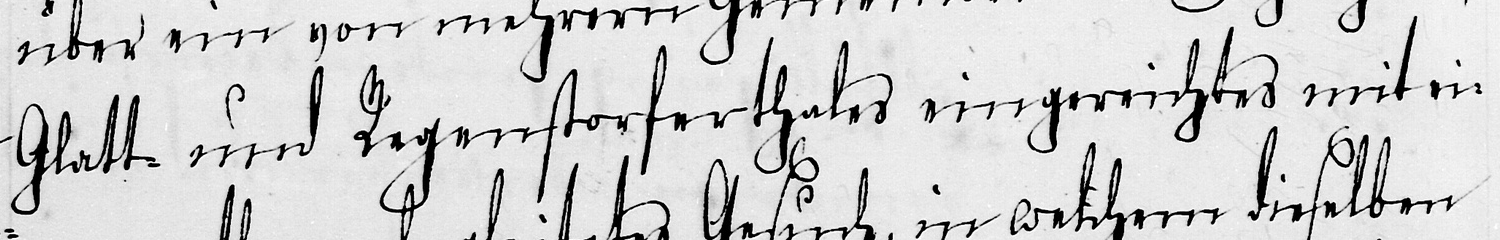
Glatt- und Regenstorferthales eingereichtes mit ei¬
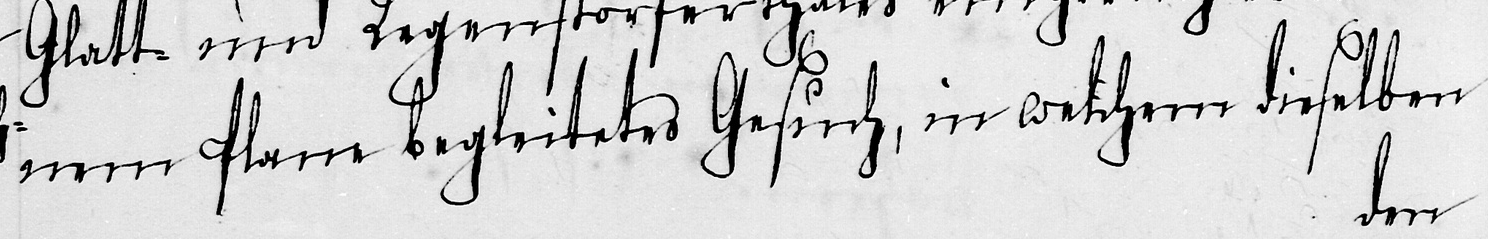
nem Plane begleitetes Gesuch, in welchem dieselben
